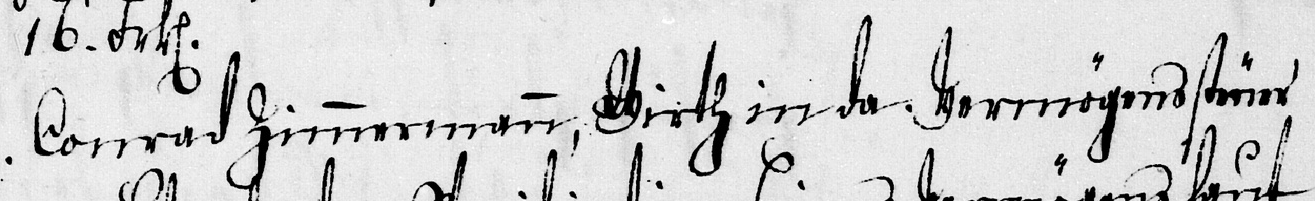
Conrad Zimmermann, Wirth in da. Vermögenssteuer
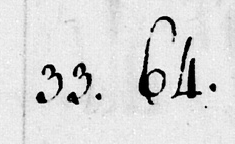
33. 64.
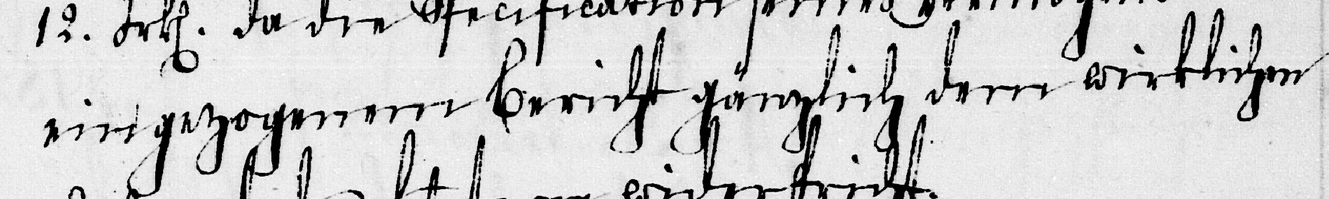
eingezogenem Bericht gänzlich dem wirklichen
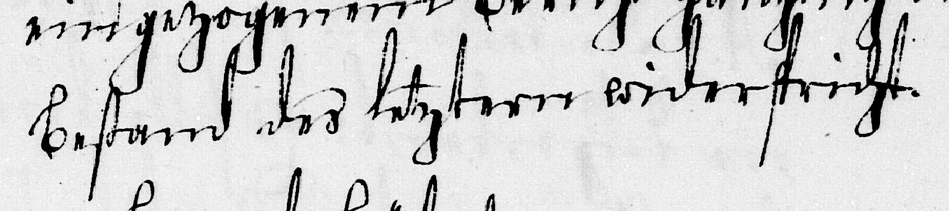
Bestand des letztern widerspricht.
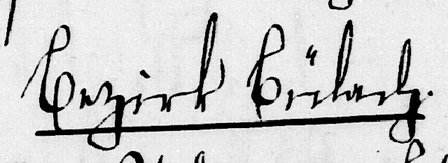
Bezirk Bülach.
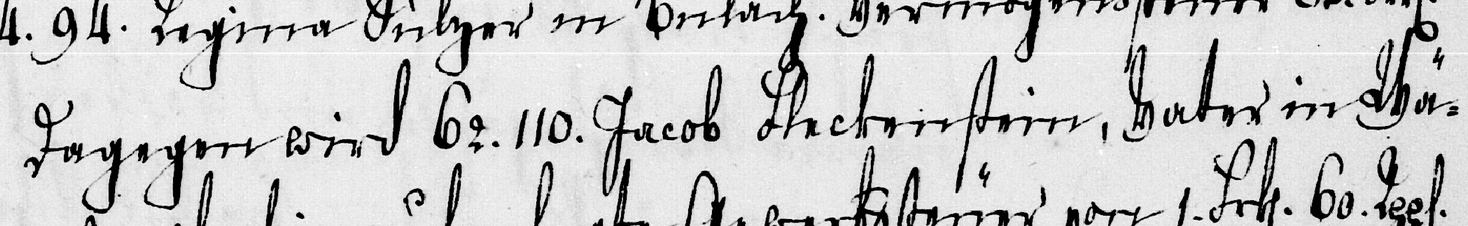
Dagegen wird 62. 110. Jacob Fleckenstein, Vater in Wä¬
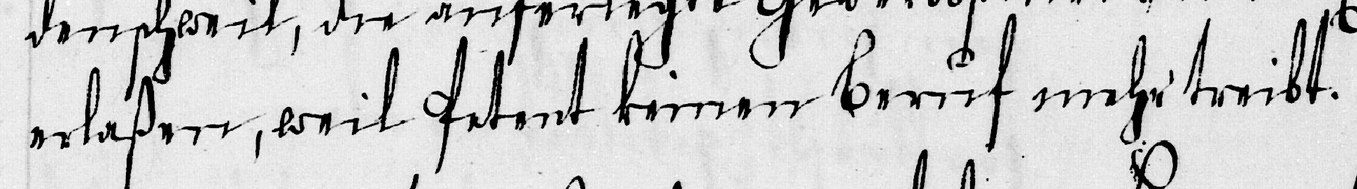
erlaßen, weil Petent keinen Beruf mehr treibt.
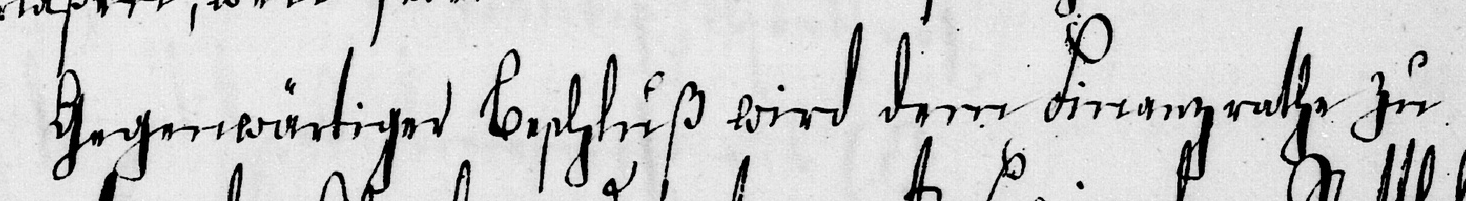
Gegenwärtiger Beschluß wird dem Finanzrathe zu
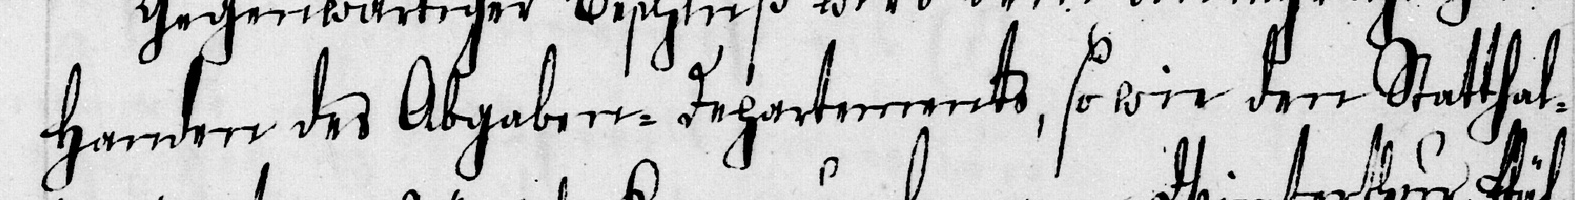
Handen des Abgaben-Departements, so wie den Stattha¬
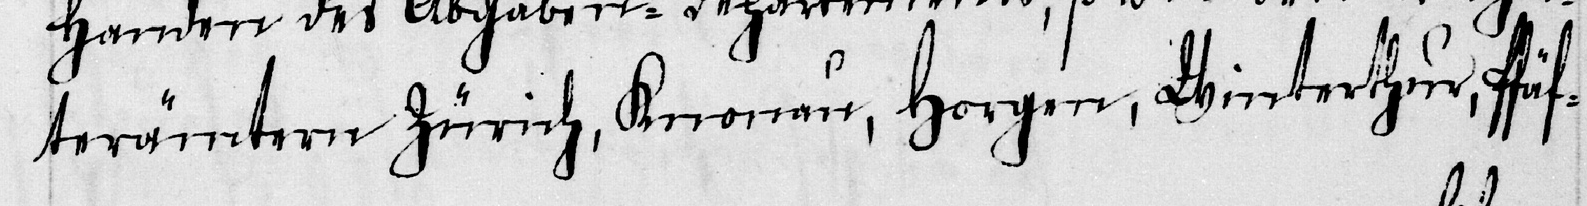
lterämtern Zürich, Knonau, Horgen, Winterthur, Pfäf-
